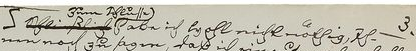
ständlicher Act der Gerechtigkeit
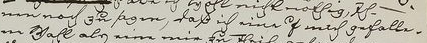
nen noch zu sagen, daß ich eine auf mich gefalle-
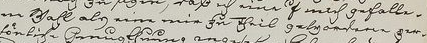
ne Wahl als eine mir zu Theil gewordene per-
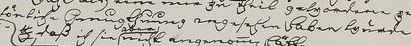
sönliche Genugthuung angesehen haben würde,
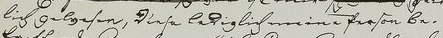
lich gewesen, diese lediglich meine Person be-
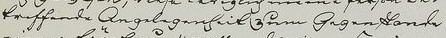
treffende Angelegenheit zum Gegenstande
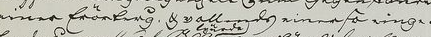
einer Erörterg. & vollends einer so einge-
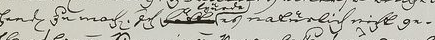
henden zu machen. Ich hättewürde es natürlich nicht ge-
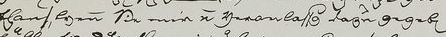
haben, wenn Sie mir nicht Veranlassung dazu gegeben
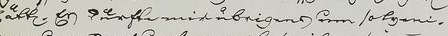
hätten. Es dürfte mir übrigens um so weni-
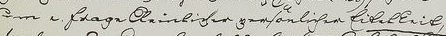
um e. Frage kleinlicher persönlicher Eitelkeit,
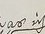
sondern darum
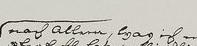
nach Allem, was ich
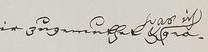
mir zugemuthet & was ich
